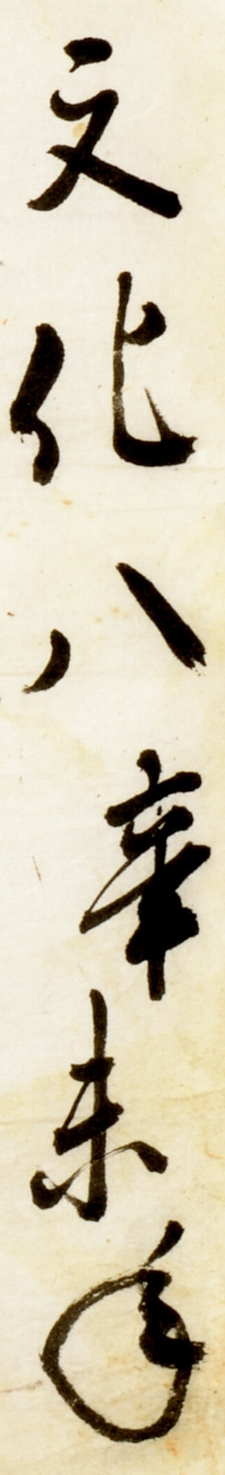文化八辛未年
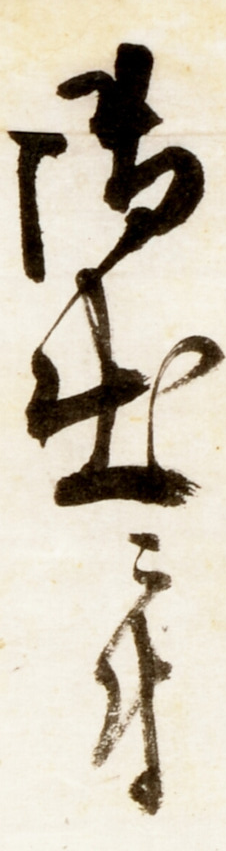御出ニ付

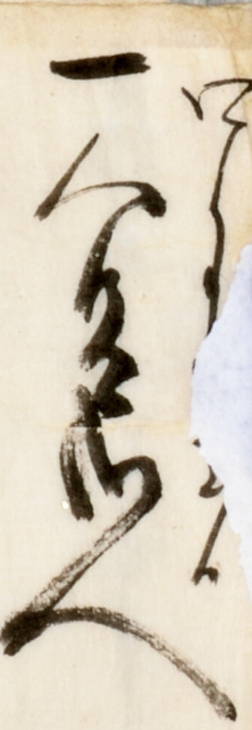一人足弐人
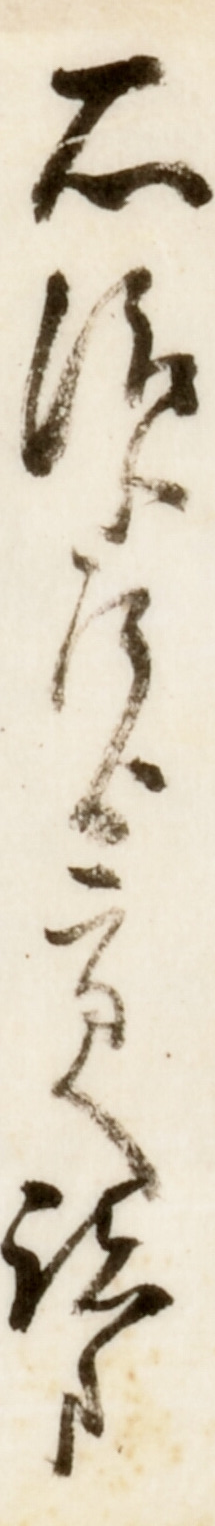右治郎左衛門方へ諸事
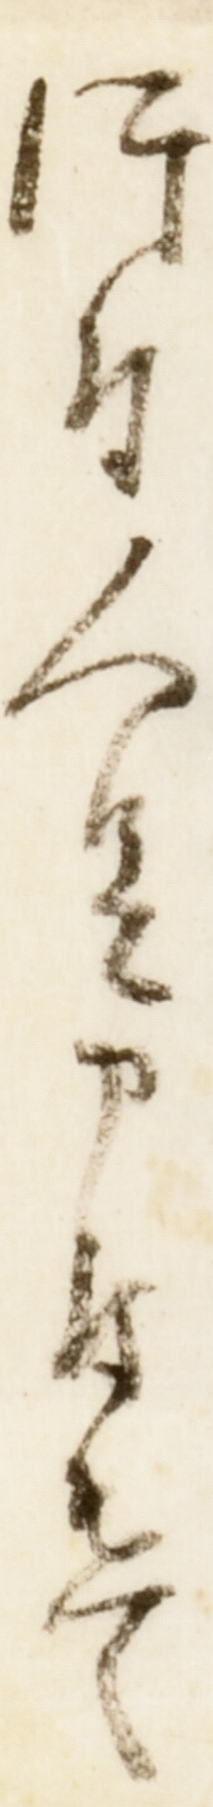片付人足申付遣候
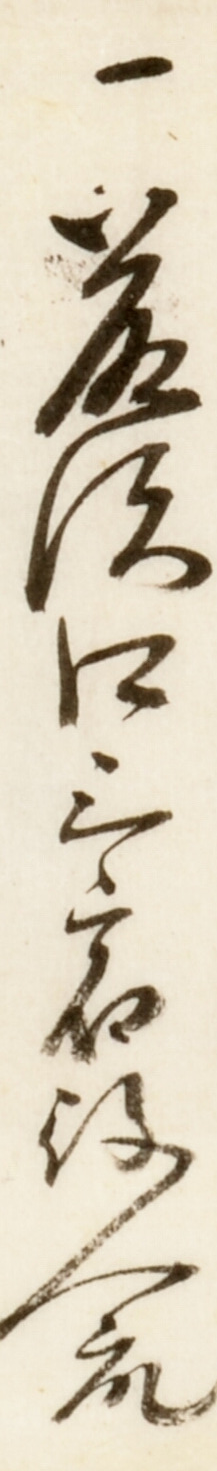一藤沢口三宿役人衆
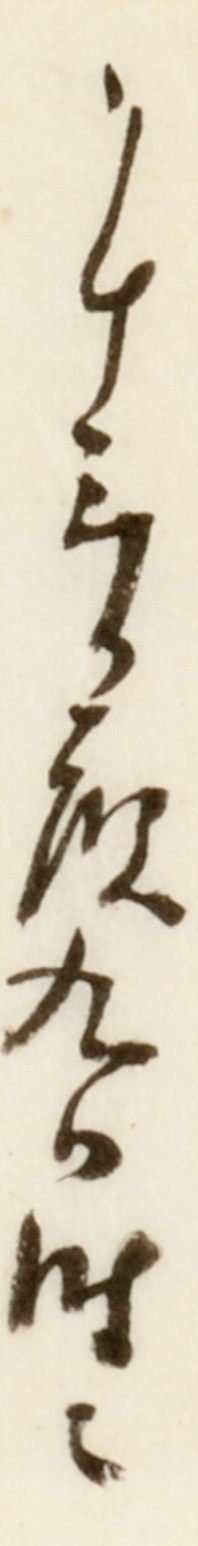同十三日夜九ツ時ニ
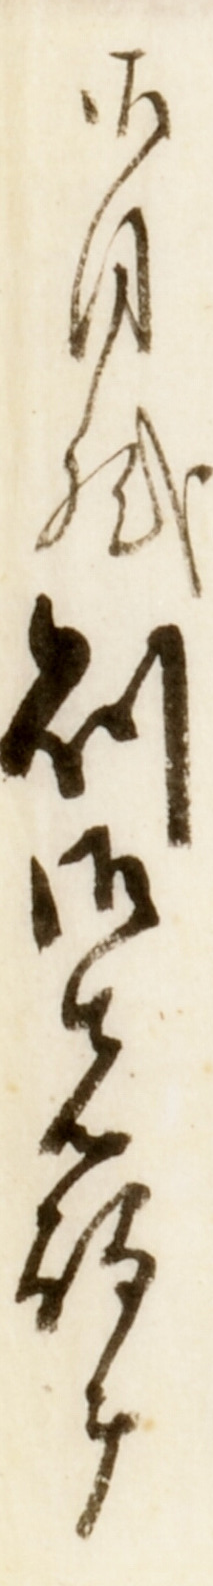御目掛則御先触ヲ
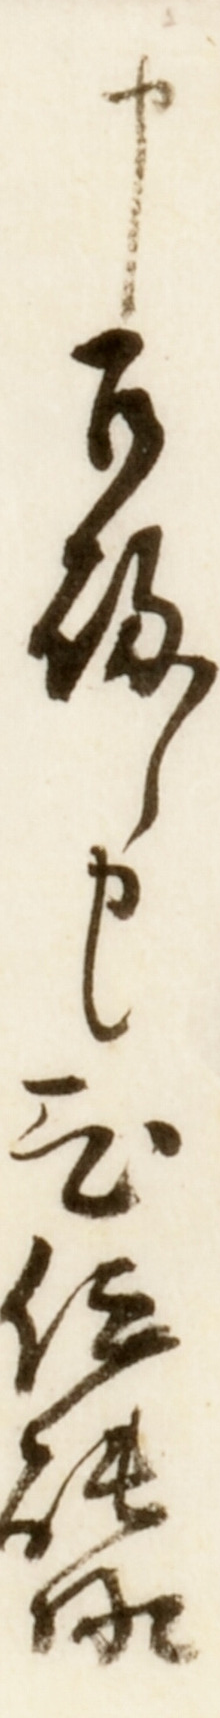申罷帰り申候尤伊能様
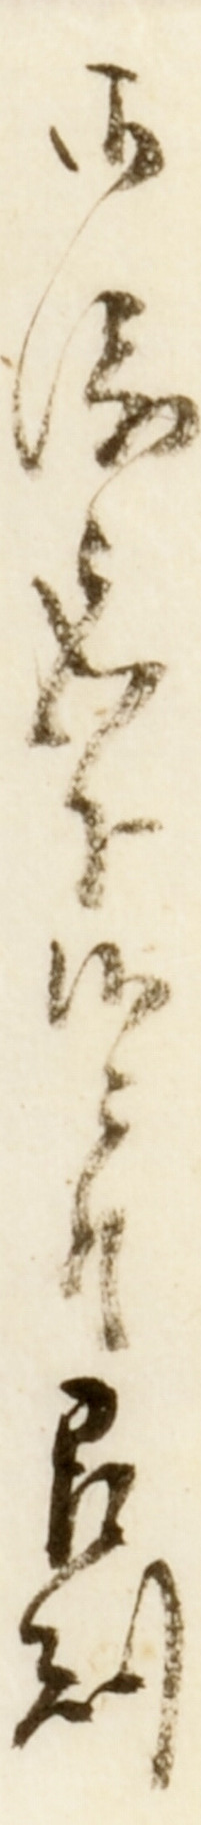御渡被成下候ニ付即刻
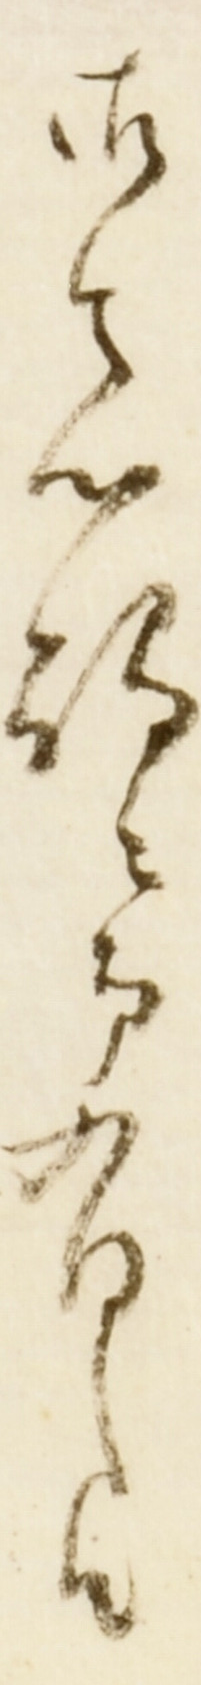御先触ニ而有之候
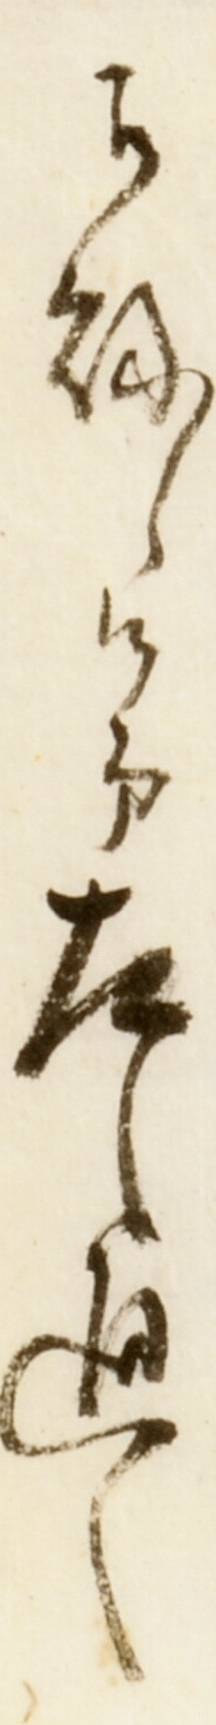罷帰り候而左之通之
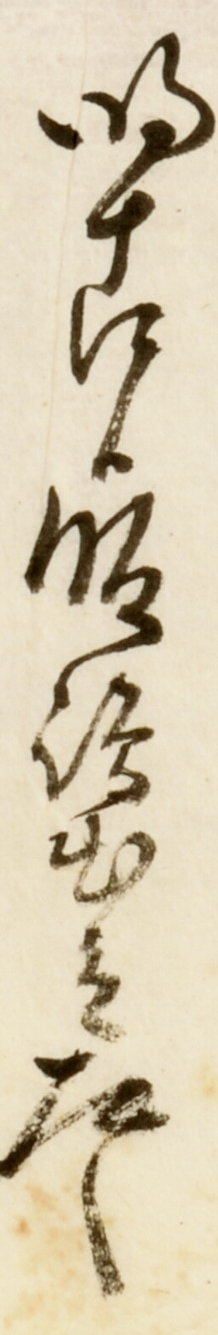明十四日飯嶋出立左之
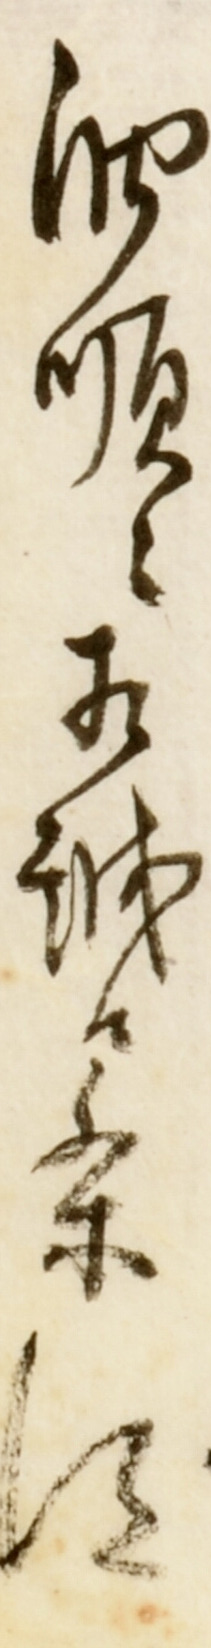泊順ニ相越候条得
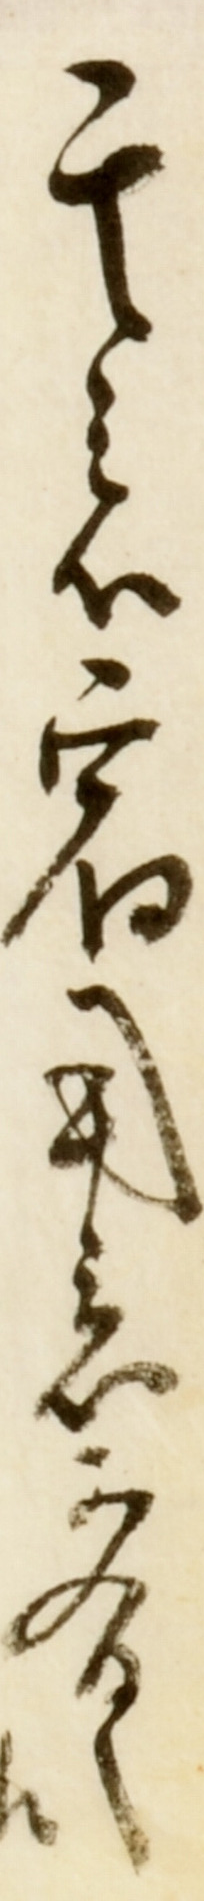其意宿用意可有之候
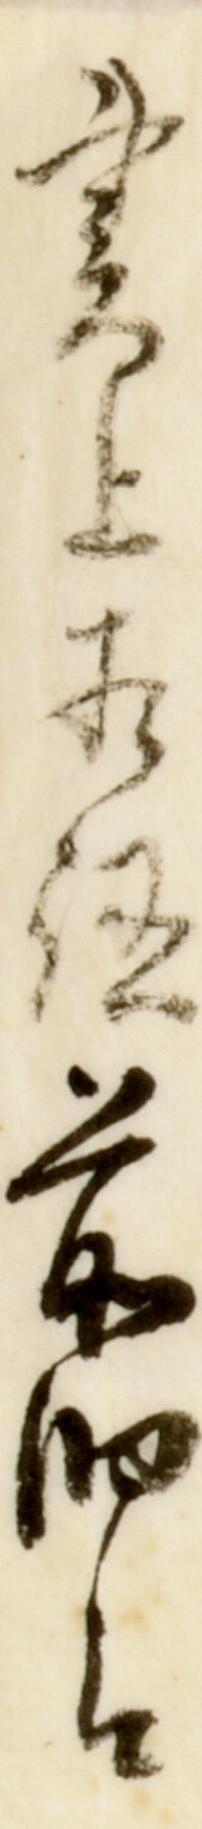書上相認前泊江
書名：諸事控帳
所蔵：伊那市立高遠町図書館・合同会社AMANE
